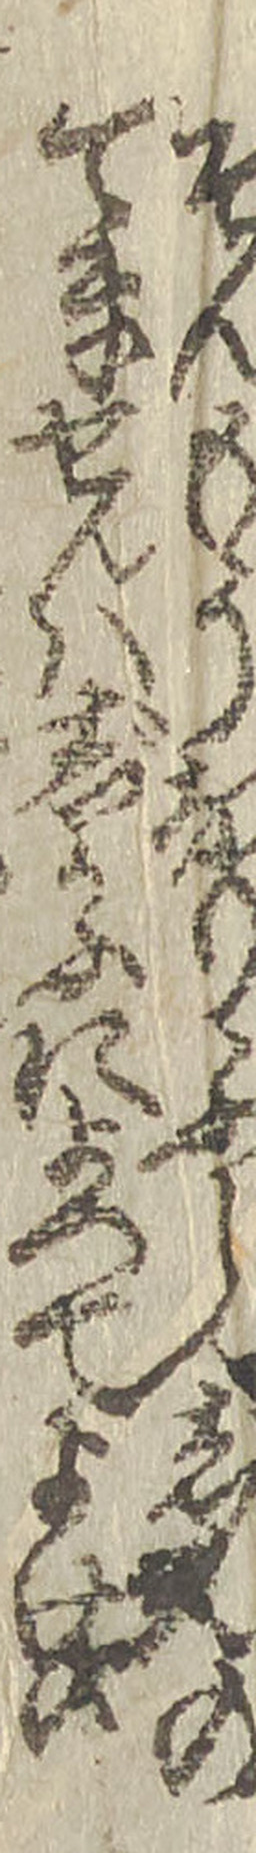てませんはじかふによつてよけひ
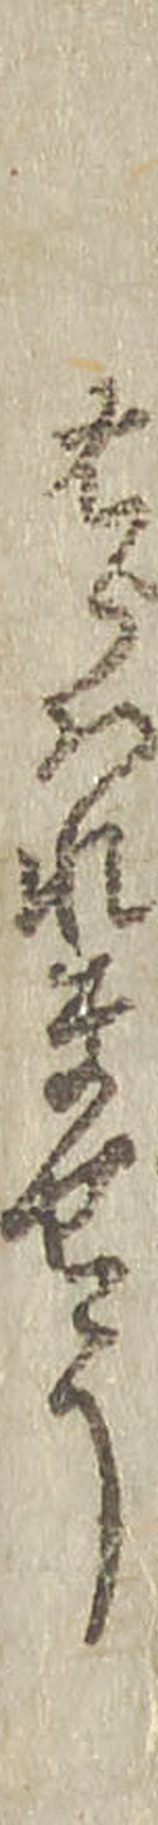はらはれませう
